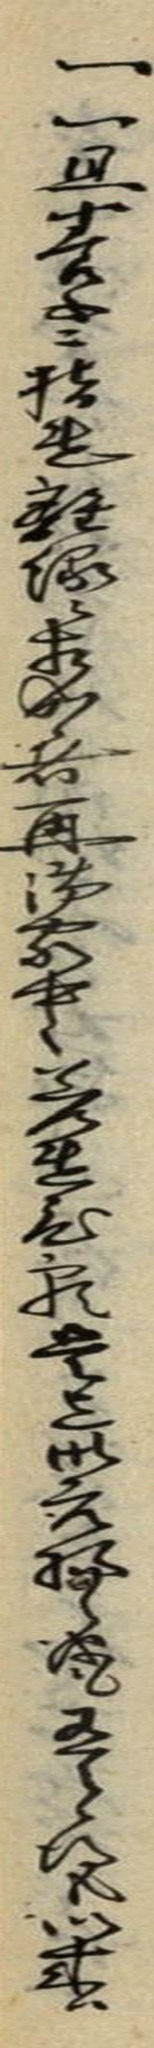一一旦養子ニ指遣離縁ニ相成候者再御家中へ差遣度願是迄御取揚之儀も有之候得共以来ハ
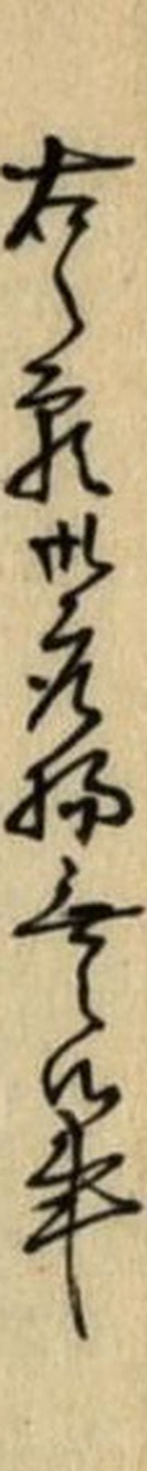右之願御取揚無之候事
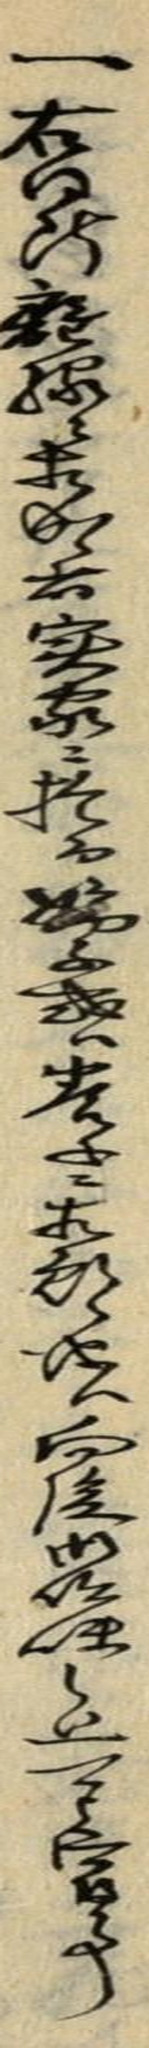一右同断離縁ニ相成候者実家ニ於而嫡子或ハ養子ニ相願候儀ハ向後御吟味之上可被仰付事
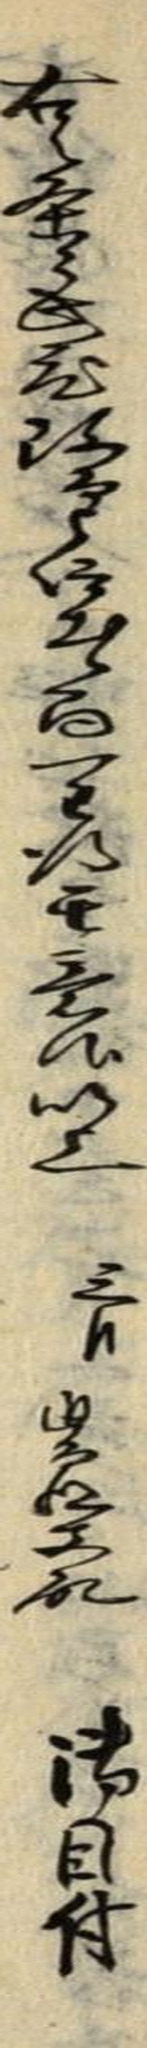右之条々此度改而被仰出候間可被得其意候以上三月追而組支配御目付
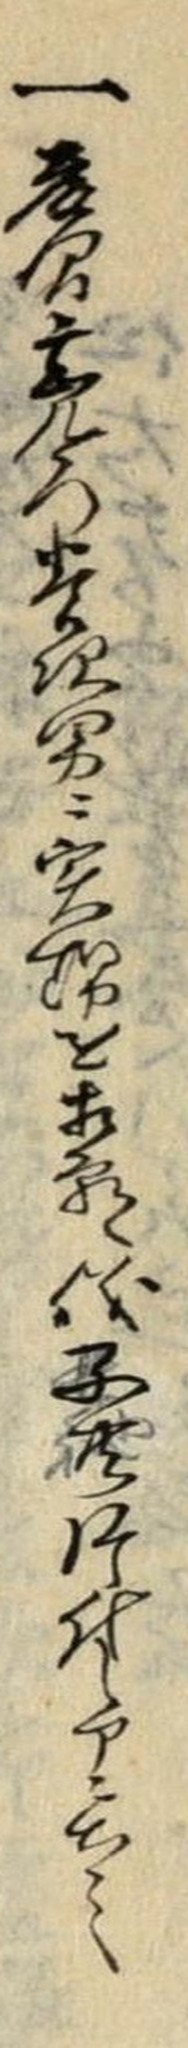一藤間甚左衛門養次男ニ実甥を相願候儀子共片付之部ニ出之
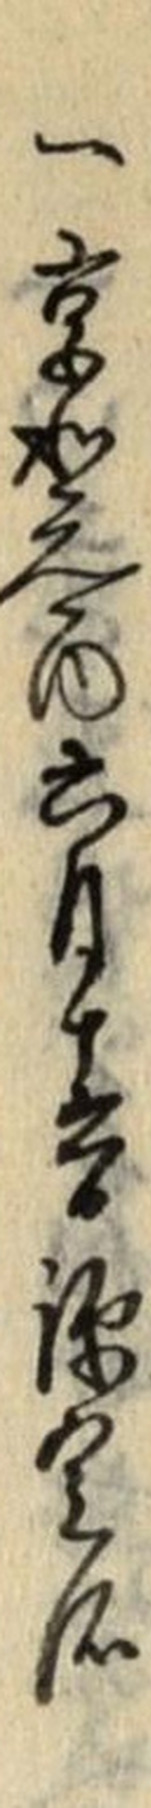一享和元酉六月十六日評定所
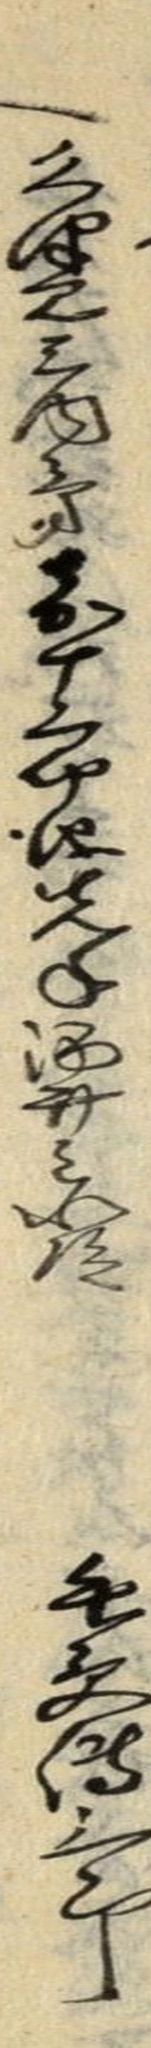久津見三内弟嘉十郎儀先年酒井主水殿毛受伝三郎
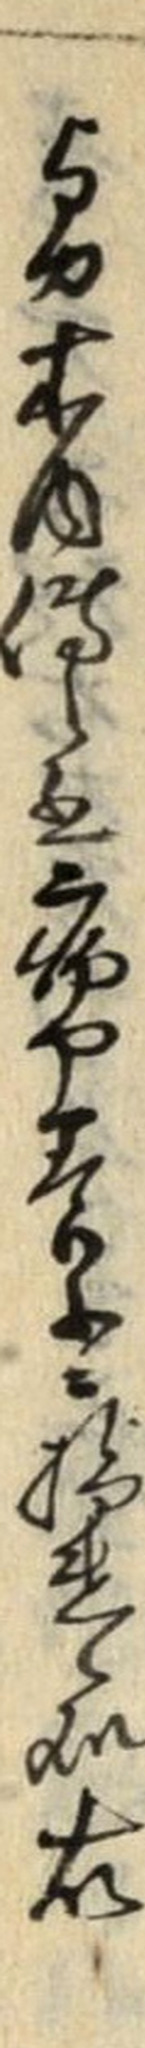与力木内伝之丞病中養子ニ指遣候処右
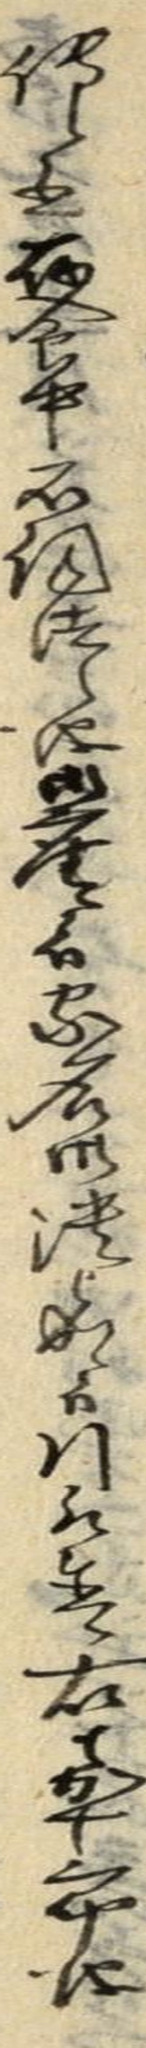伝之丞存命中不調法之儀御座候ニ付家名御潰被成候ニ付引取置候右嘉十郎儀
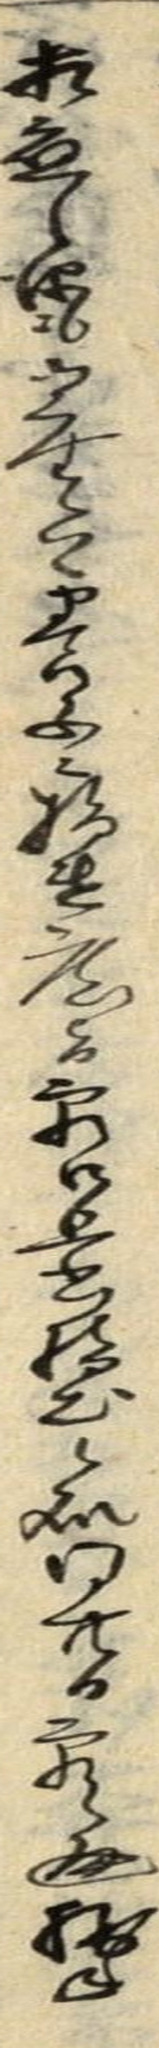相応之儀も御座候ハヽ養子ニ指遣度旨願口上書指出候処同廿日願之通勝手
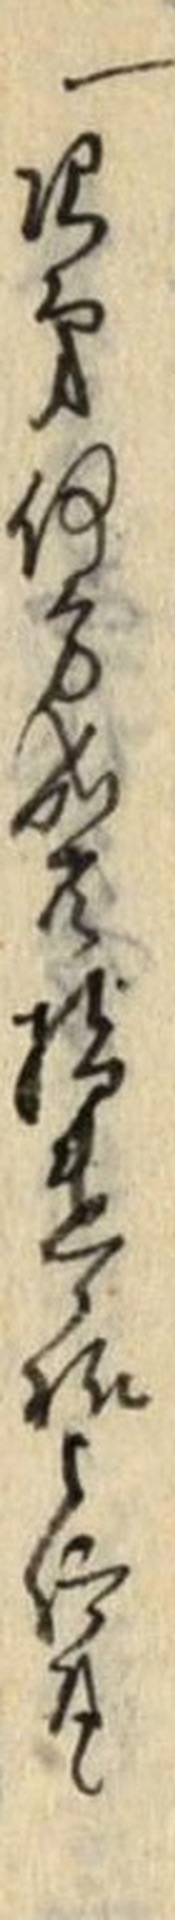次第何方成共指遣候様被仰付候
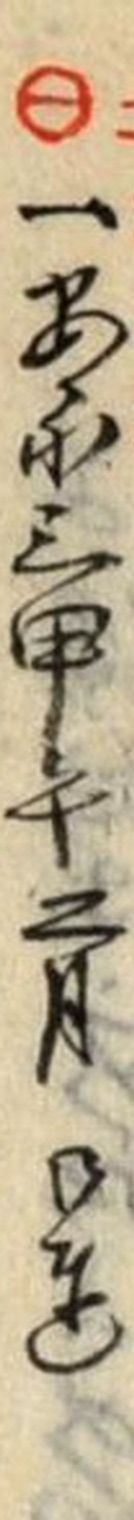一安永三甲午二月口達
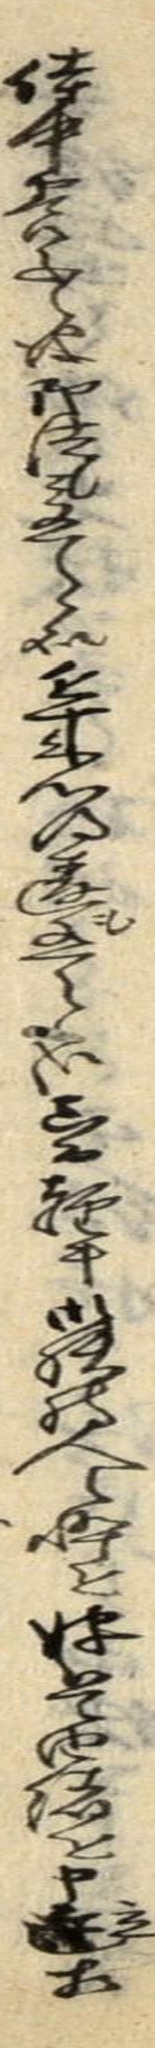侍中養子之儀御法も有之候処近来心得違も有之候哉至而軽キ御扶持人之忰を彼是由緒を申立相
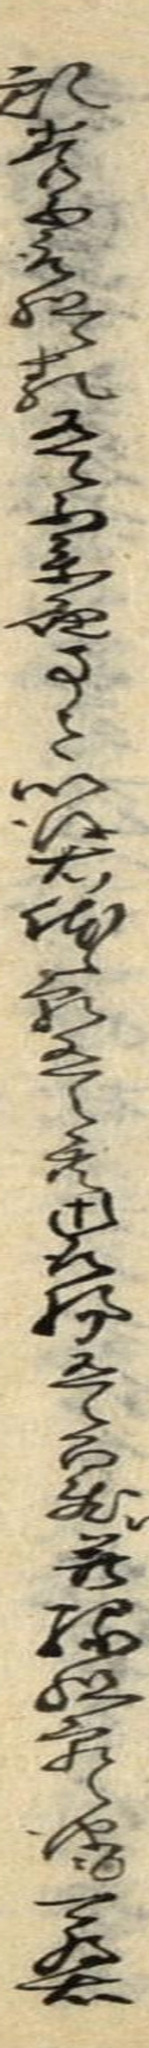願養子取組候類有之不参届事ニ候以後右体之願有之候共御取揚有之間敷候并縁組願之儀も可為右
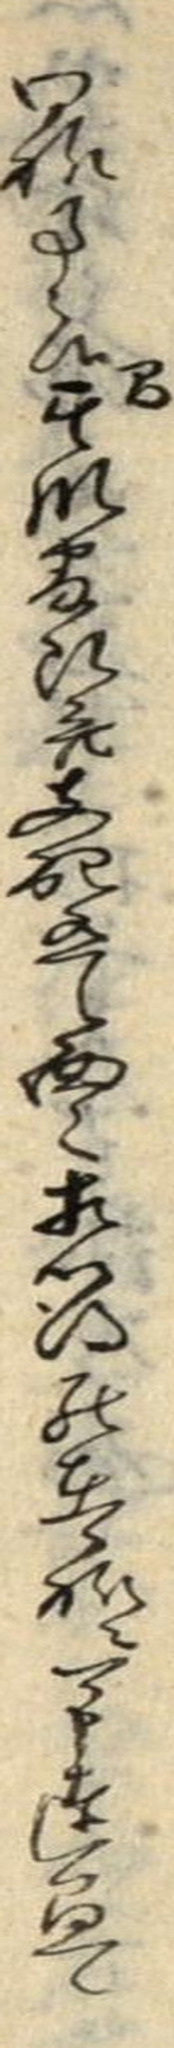同様事ニ候間其段番頭并支配有之面々相心得罷在候様ニ可申達置候

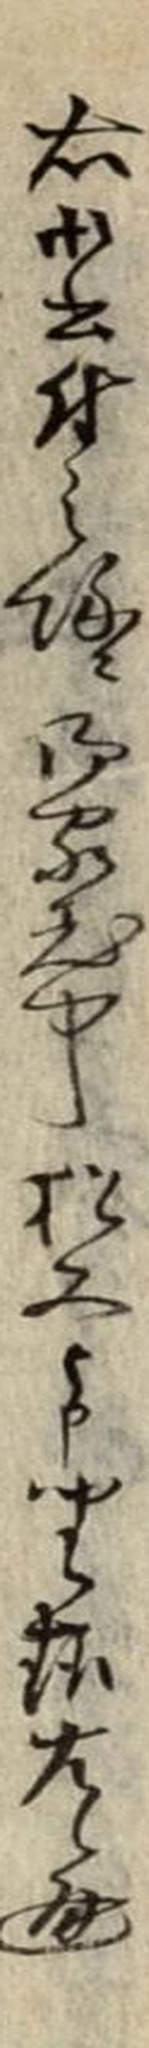右御書付之余ニ御家老中猶又被申聞候趣左之通
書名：養子縁組之部
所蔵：福井県文書館 Fukui Prefectural Archives
